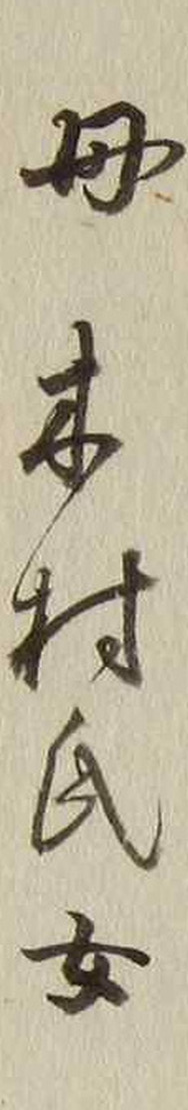母木村氏女

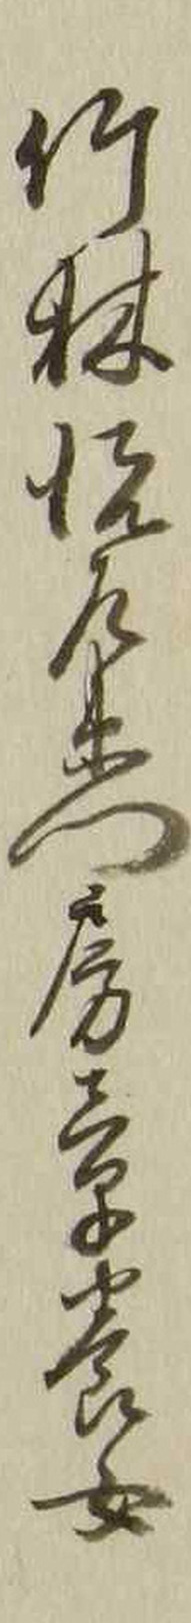竹林悦左衛門房景養女
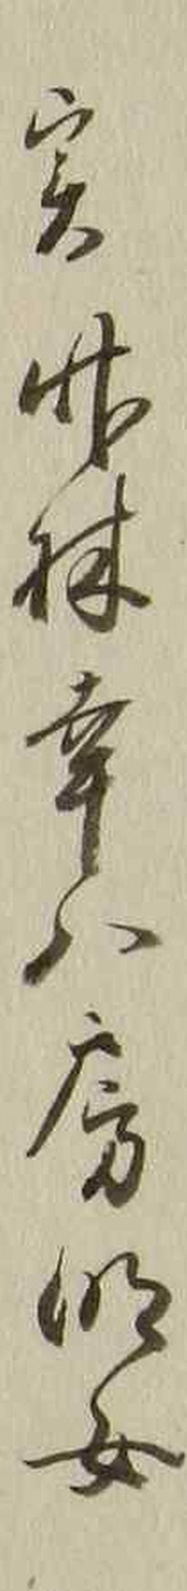実竹林幸八房明女
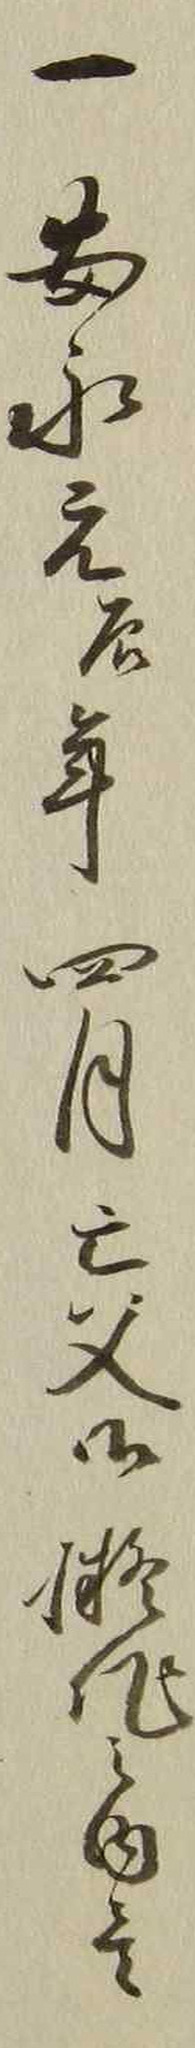一安永元辰年四月亡父御擬作之内壱
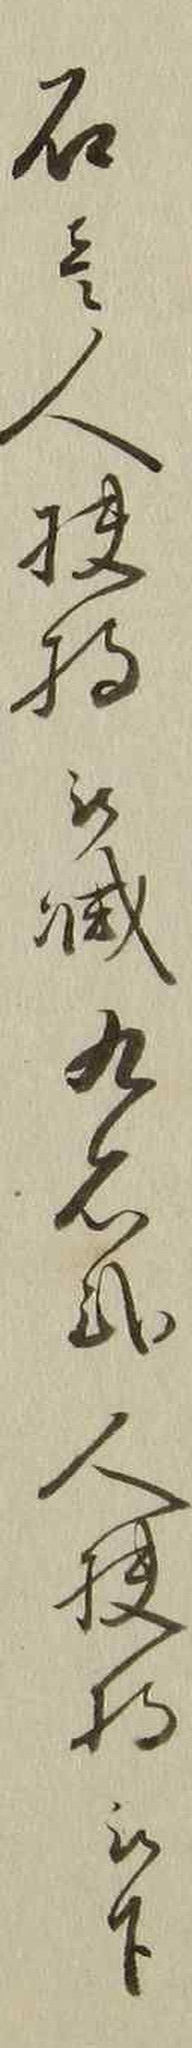石壱人扶持被減九石弐人扶持被下
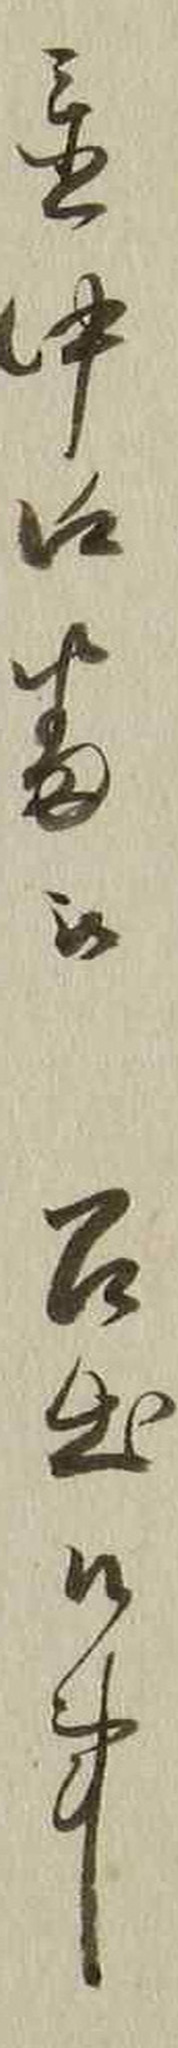置中ノ口番被召出候事
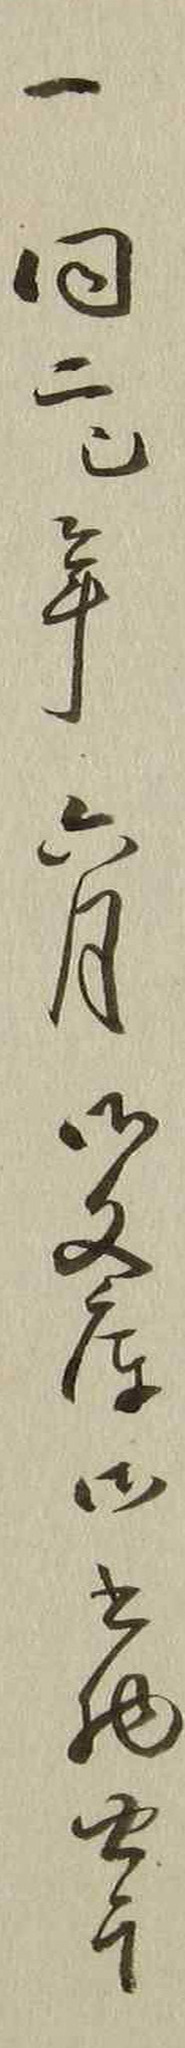一同二巳年六月御文庫御書物虫干
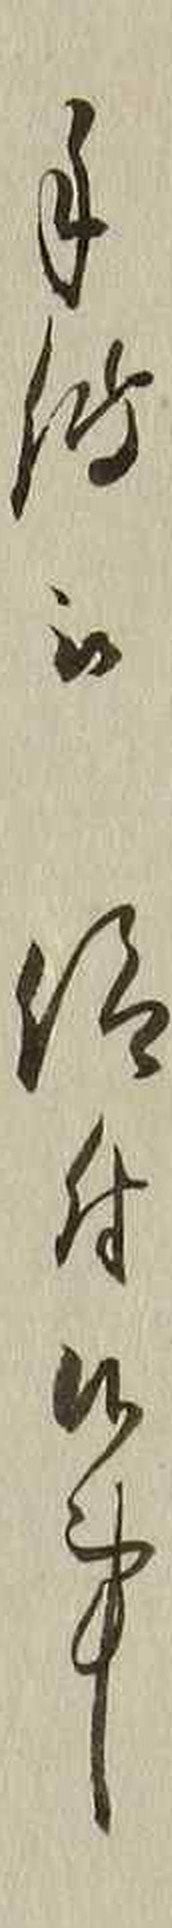手伝被仰付候事
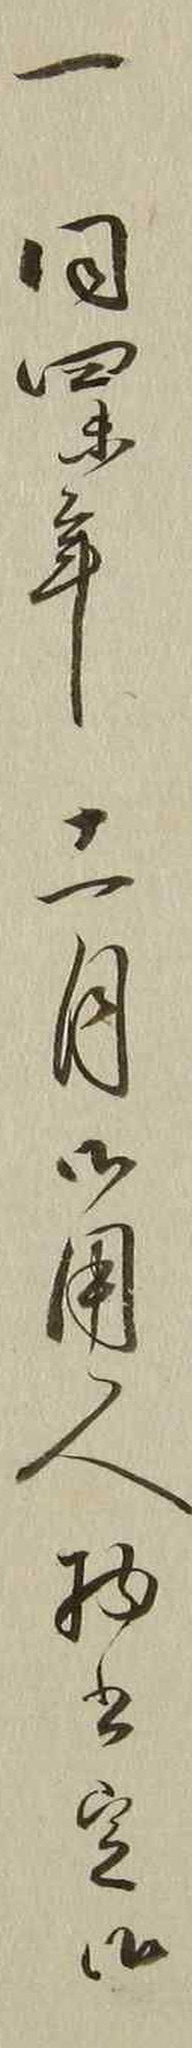一同四未年十一月御用人物書定御
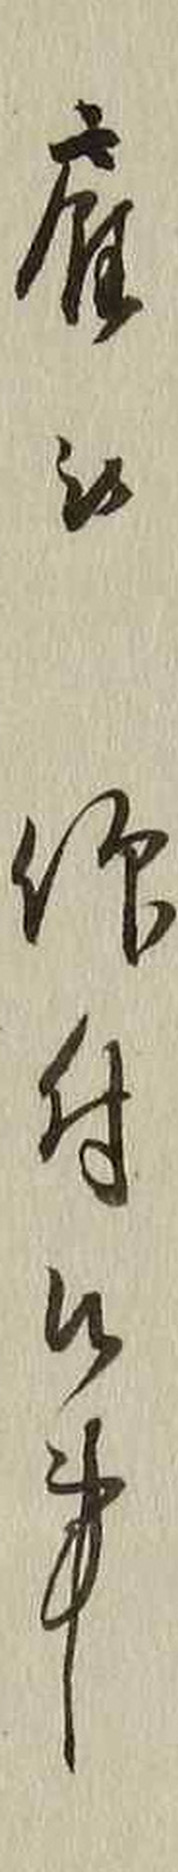雇被仰付候事
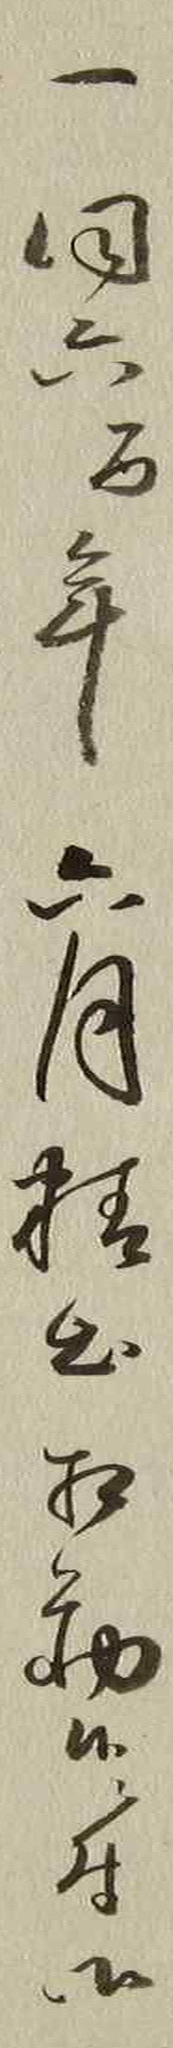一同六酉年六月精出相勤候ニ付御
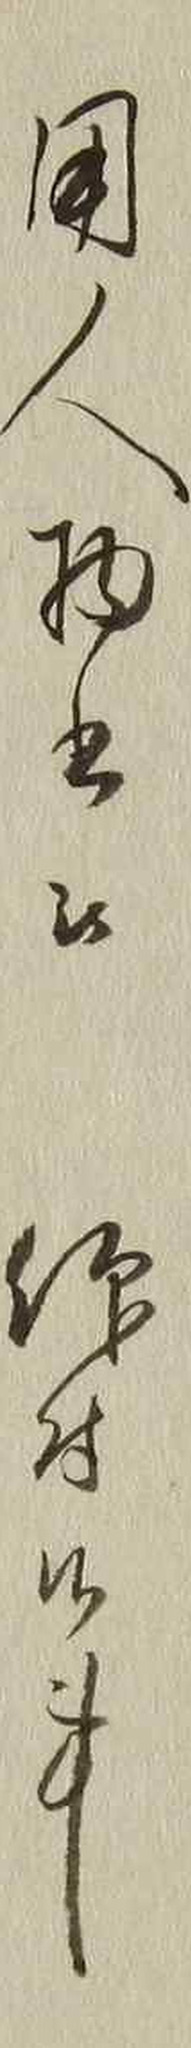用人物書被仰付候事
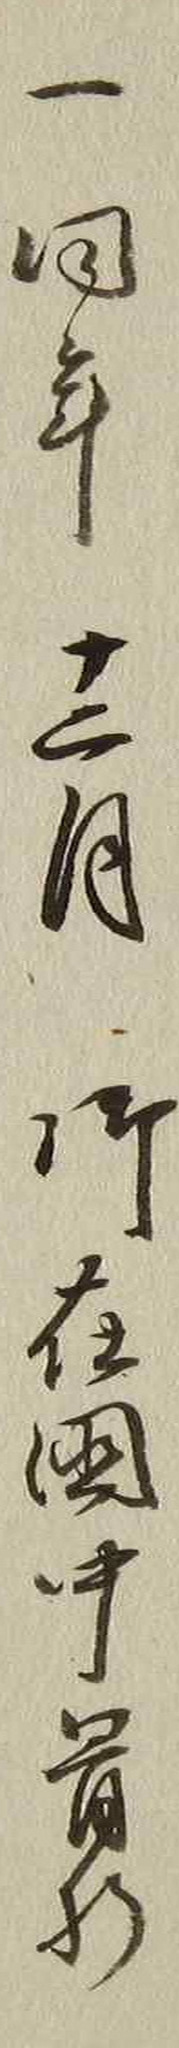一同年十二月御在国中骨折
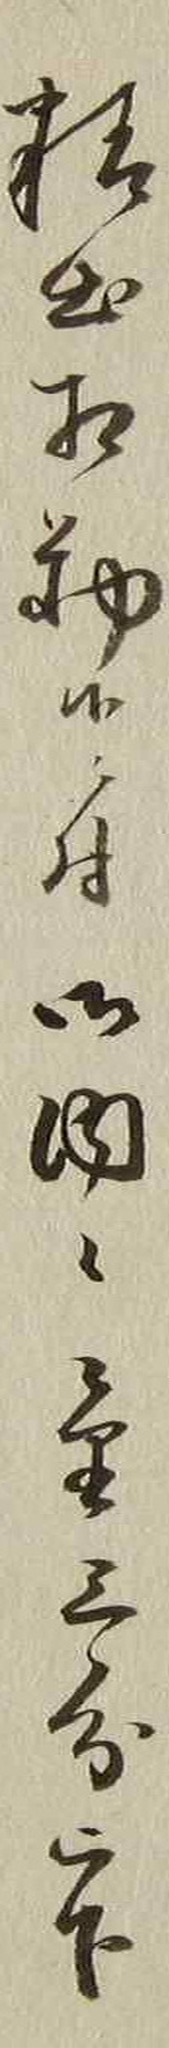精出相勤候ニ付御内々金三分被下
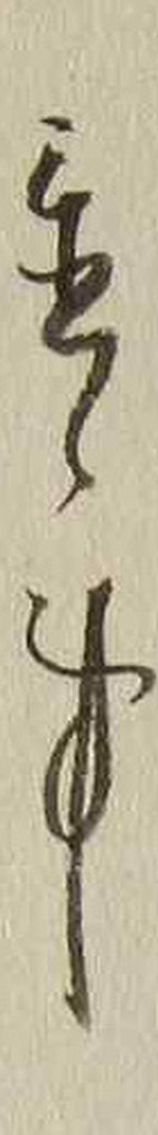置候事
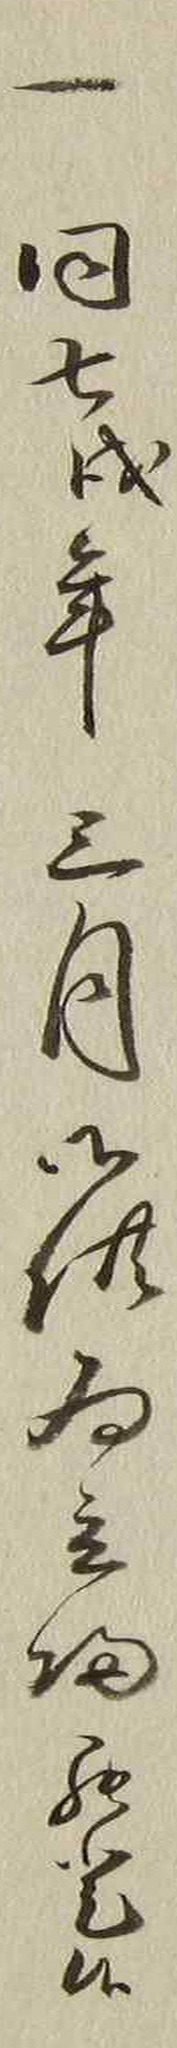一同七戌年三月御供為立帰罷登候
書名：諸士系譜　巻之52　に之部3
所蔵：会津若松市立会津図書館
